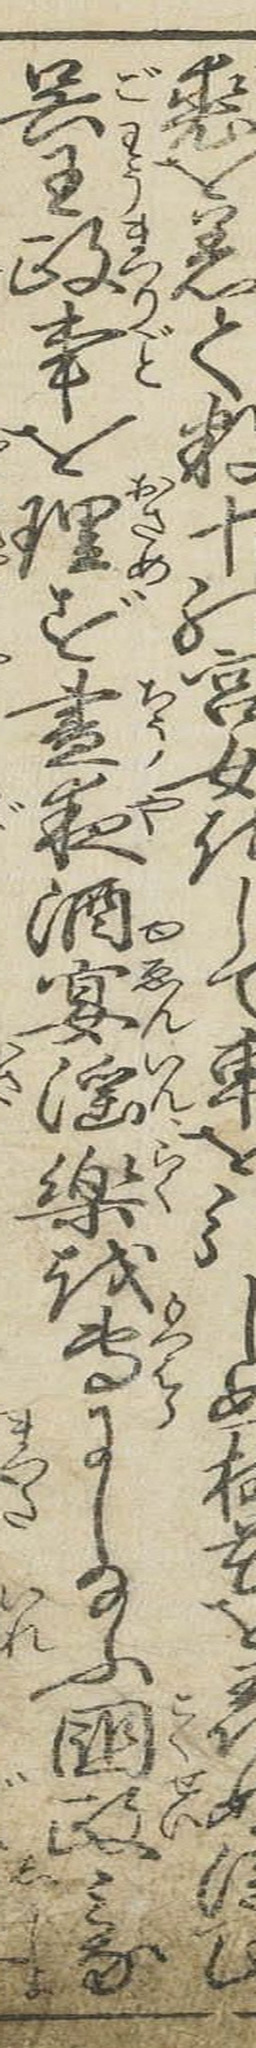呉王政事を理ず昼夜酒宴淫楽を専にし給ふ国政みな
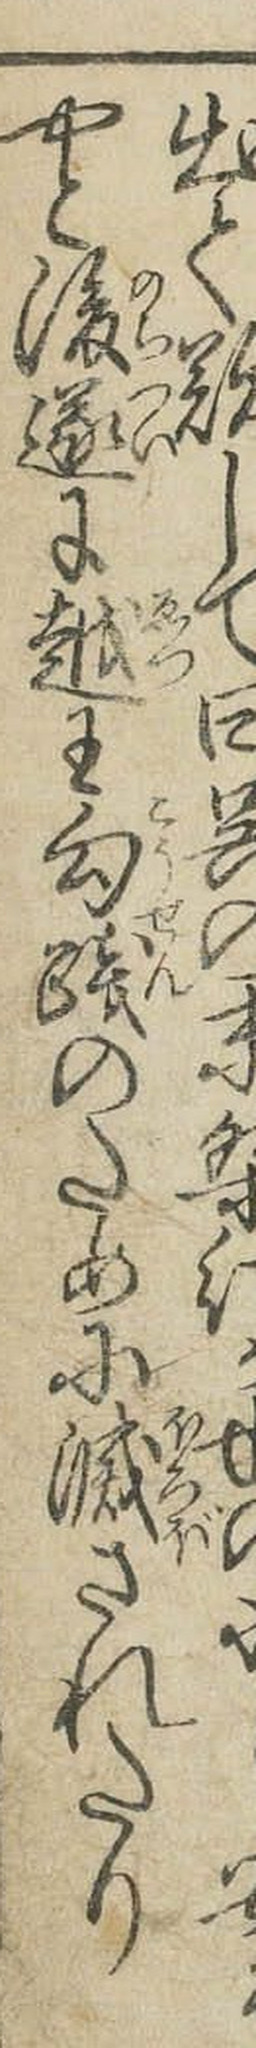やと後遂に越王句践のために滅されたり
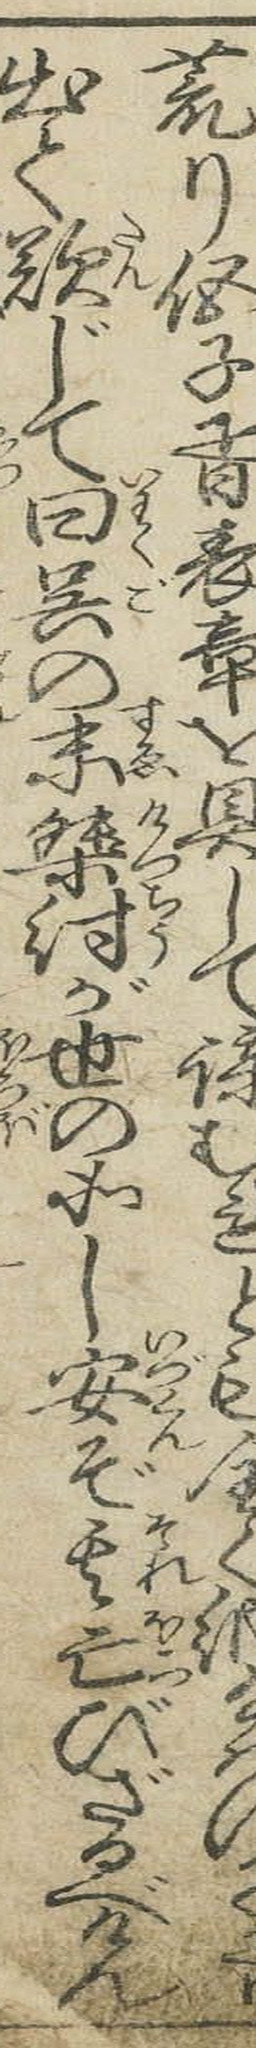出て歎じて曰呉の末桀紂が世の如し安ぞ其亡びざるべけん

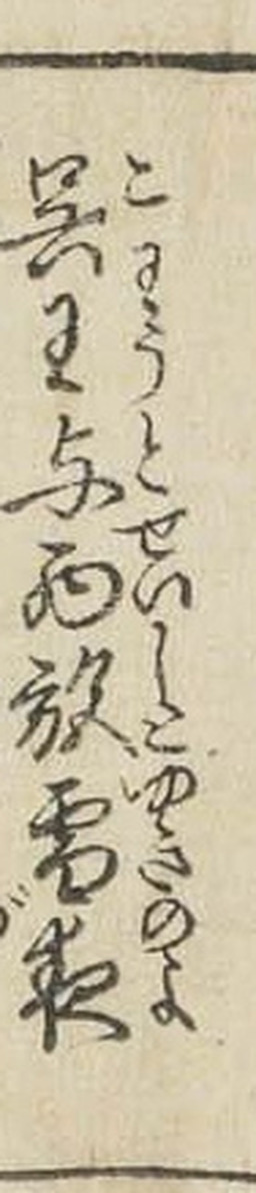呉王与西施雪夜
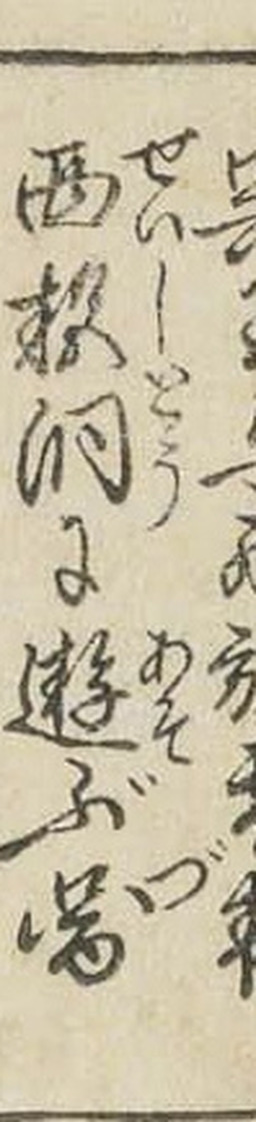西施洞に遊ぶ図

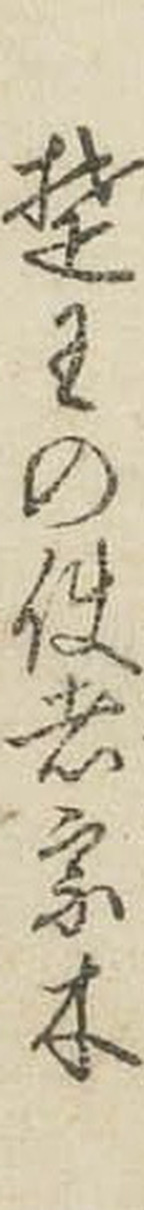楚王の使者宗木
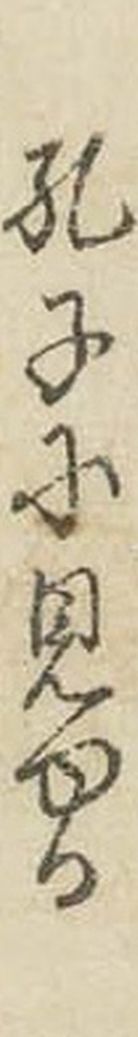孔子に見ゆる
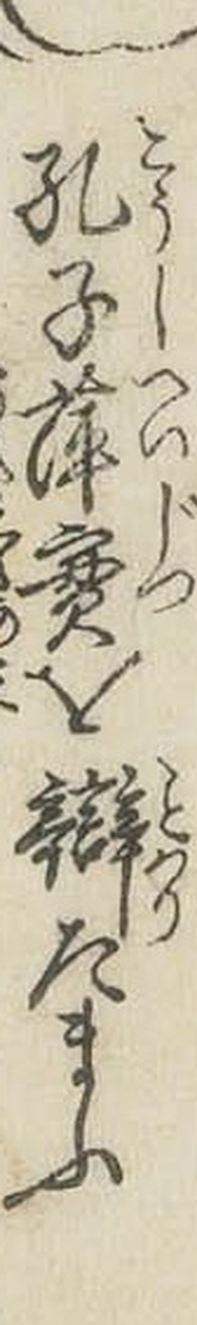孔子萍実を弁たまふ

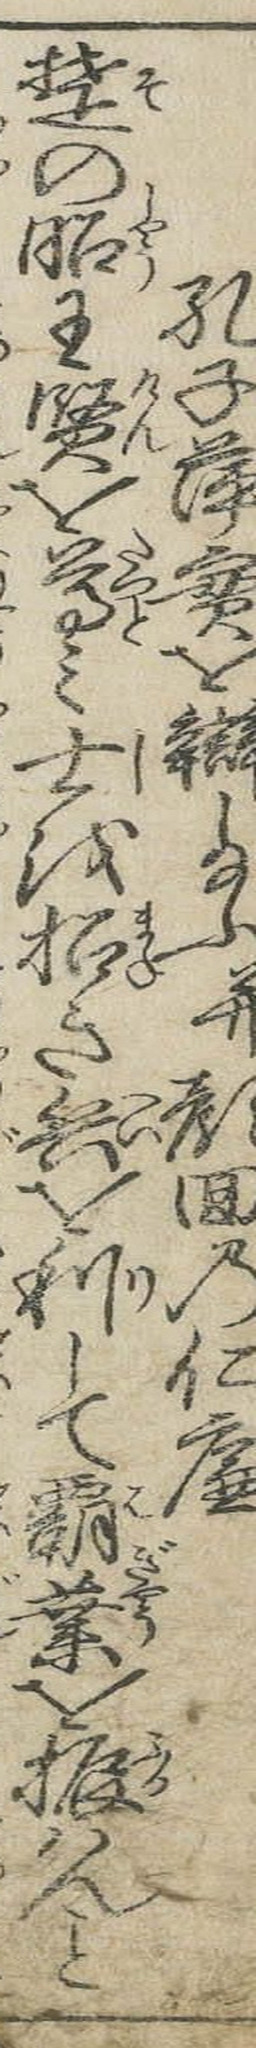楚の昭王賢を尊み士を招き兵を利して覇業を振はんこと
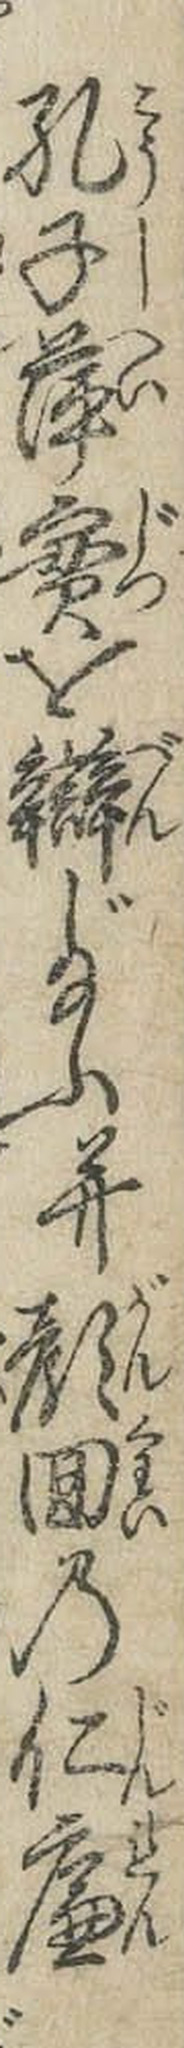孔子萍実を弁じ給ふ并顔回の仁廉
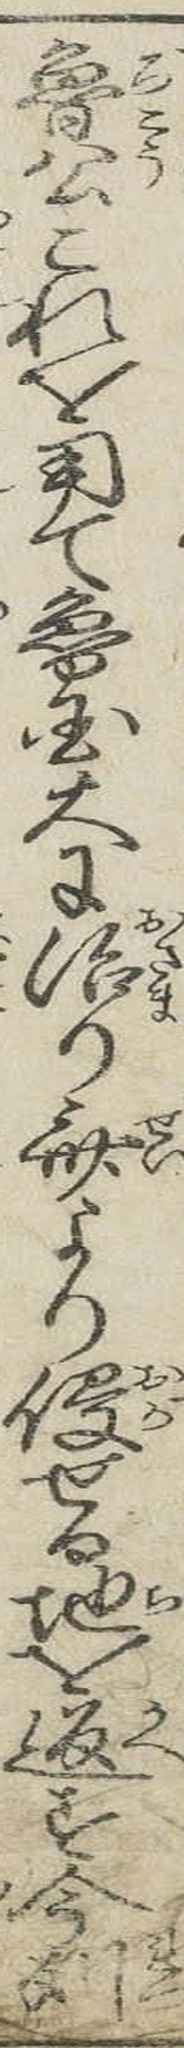魯公これを用て魯国大に治り斉より侵せる地を返す今列
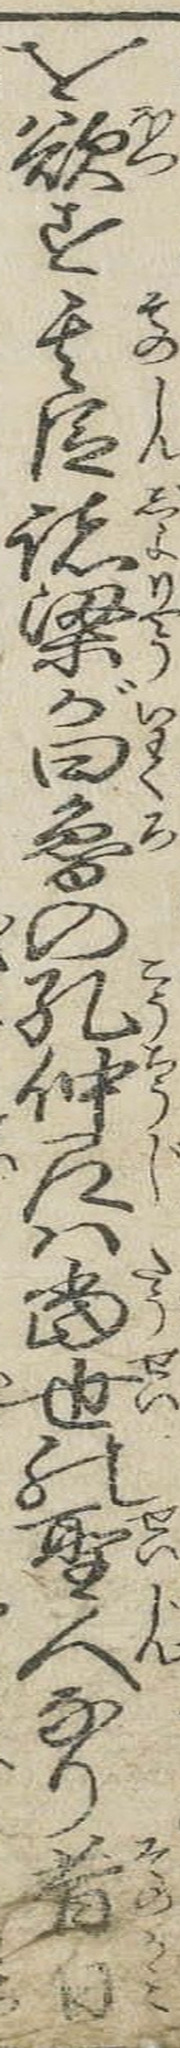を欲す其臣諸梁が曰魯の孔仲尼は当世の聖人なり昔日
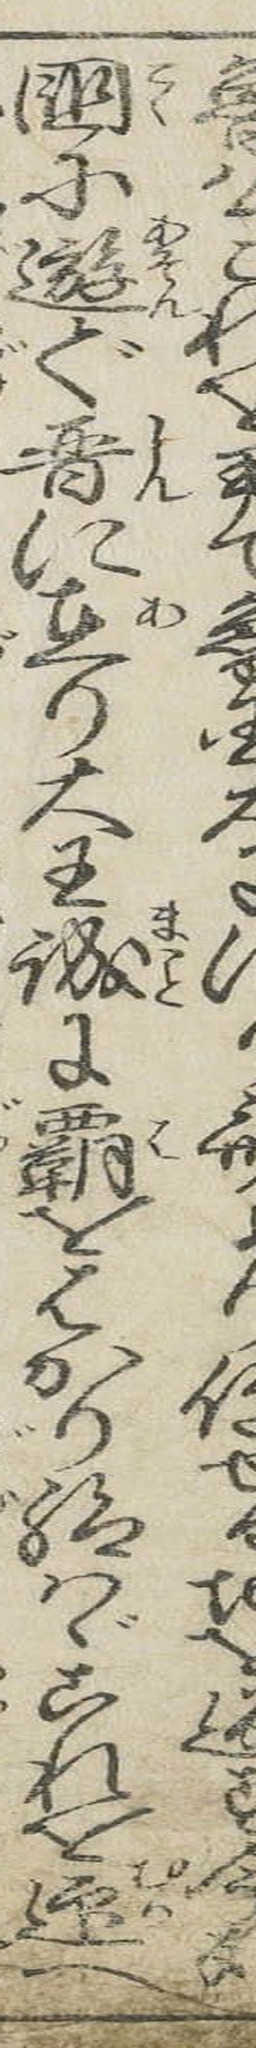国に遊で晋に在り大王誠に覇をはかり給はゞこれを迎へ
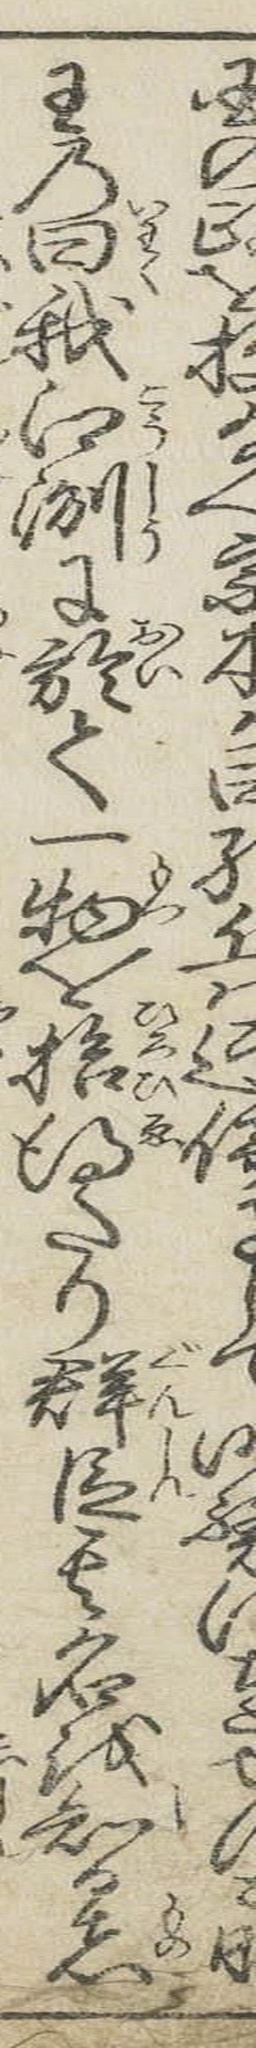王の曰我江洲に於て一物を拾得たり群臣其名を知る者
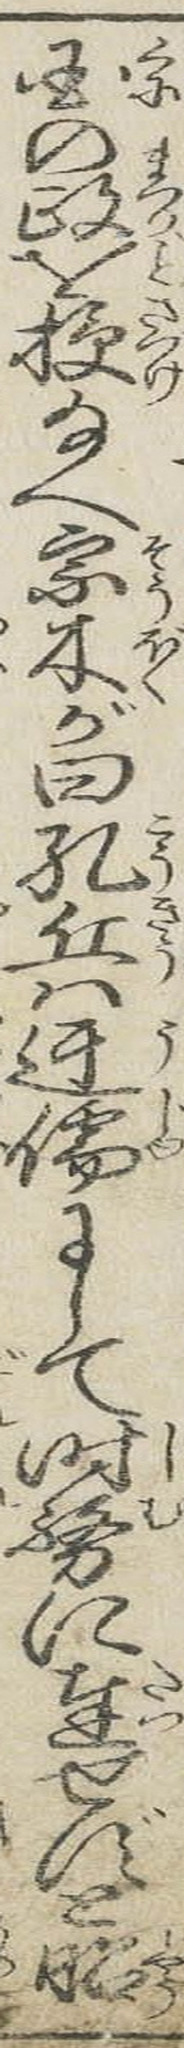国の政を授給へ宗木が曰孔丘は迂儒にして時務に達せずと昭
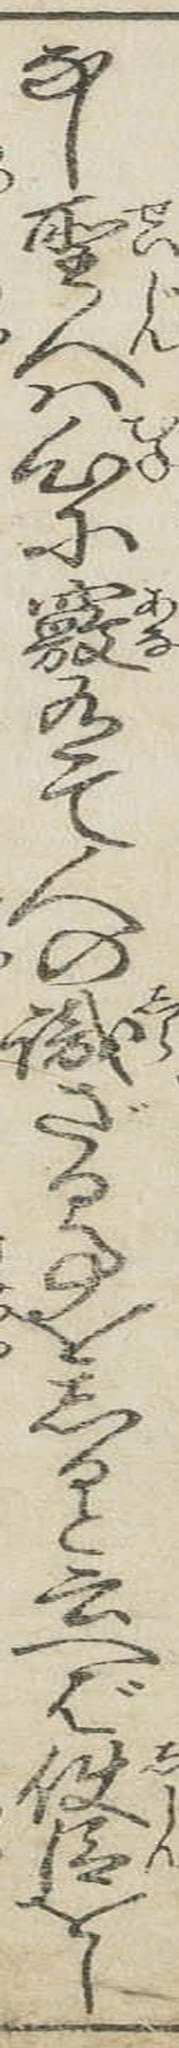なし聖人は心に竅有て人の識ざる事をしると云へば使臣をし
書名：絵本写宝袋 9巻 6之巻
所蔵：東京学芸大学教育コンテンツアーカイブ
